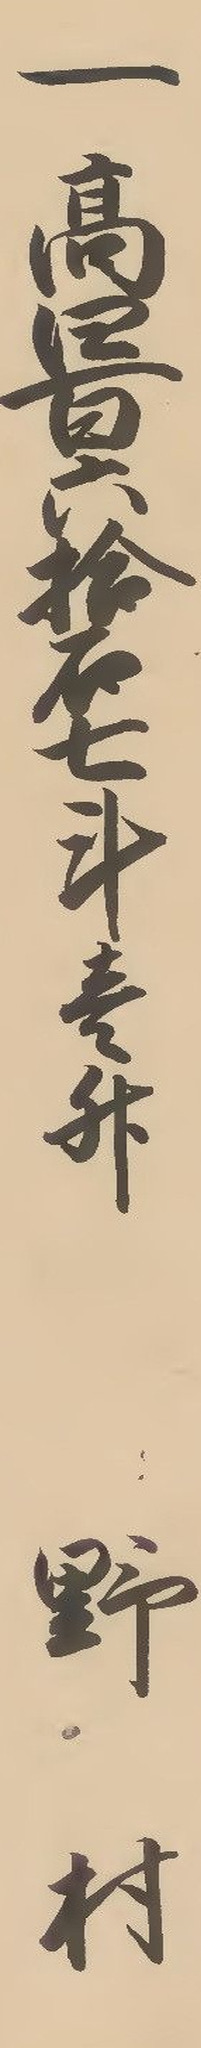一高四百六拾石七斗壱升野村
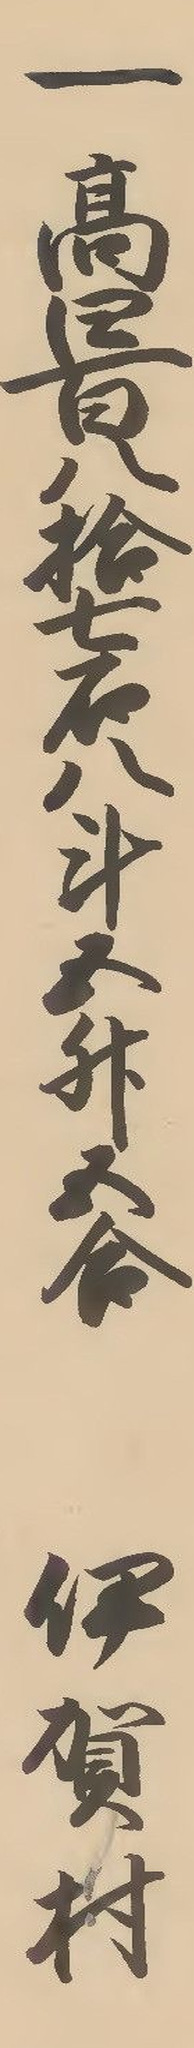一高四百八拾七石八斗五升五合伊賀村
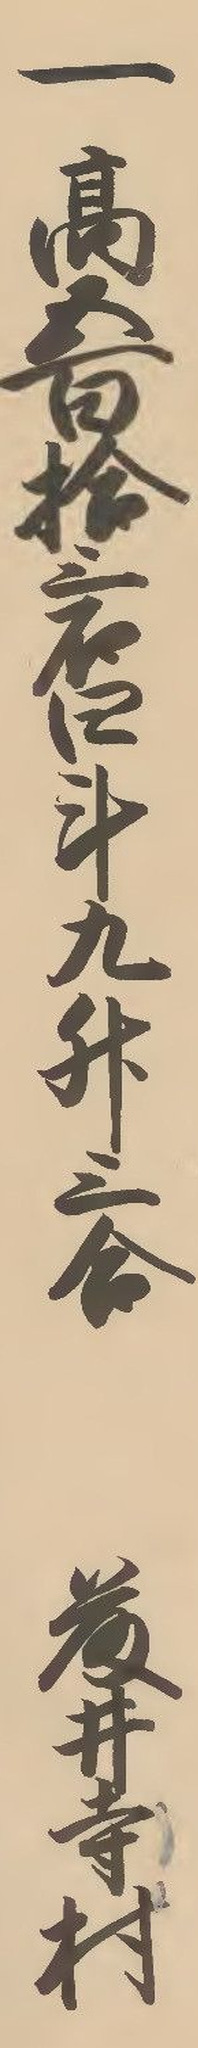一高五百拾三石四斗九升三合藤井寺村
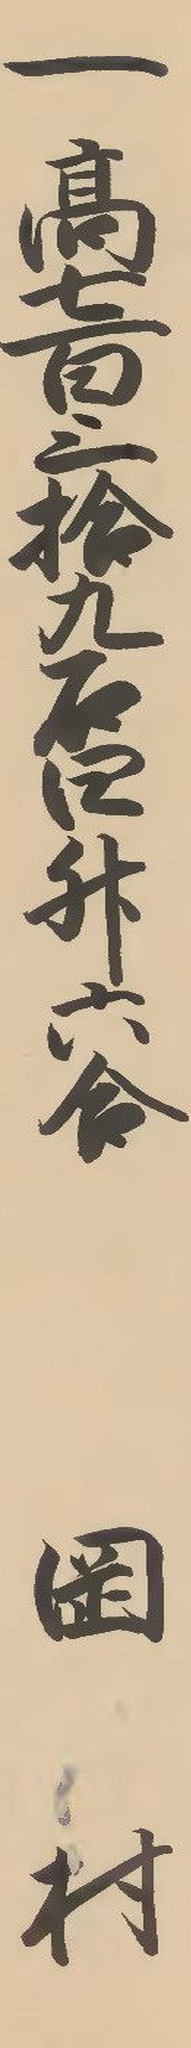一高七百三拾九石四升六合岡村
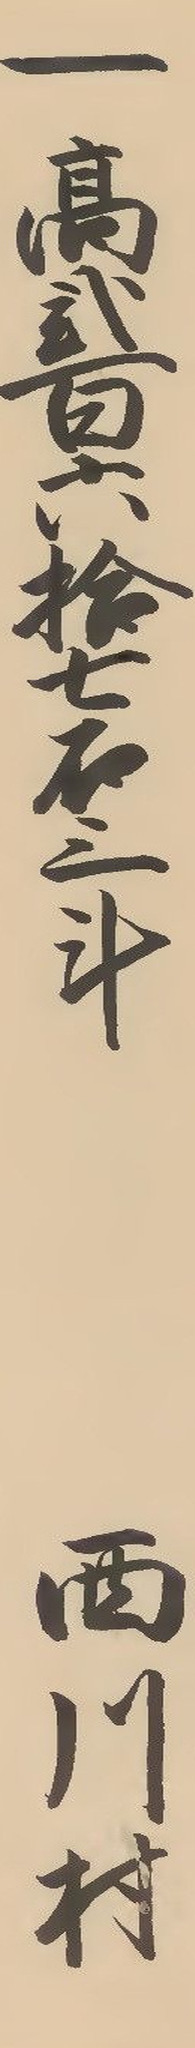一高弐百六拾七石三斗西川村

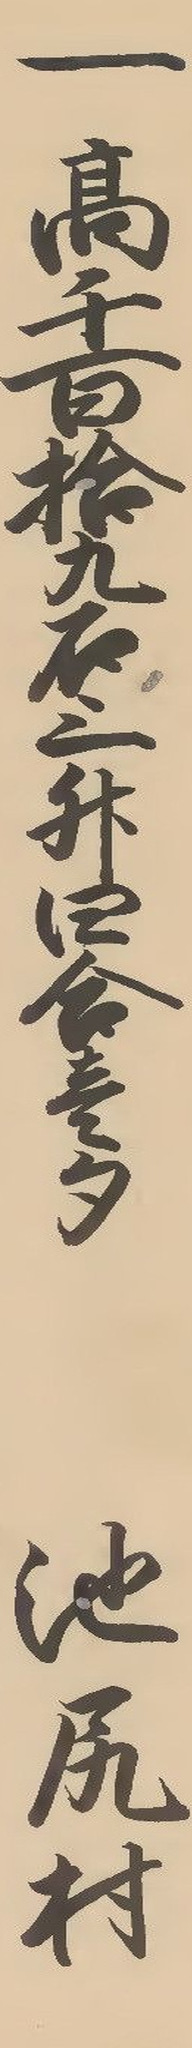一高千百拾九石三升四合壱勺池尻村
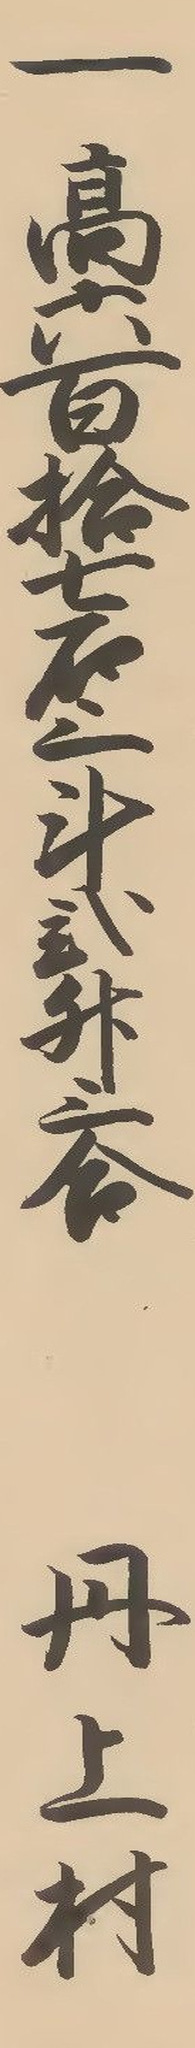一高六百拾七石三斗弐升三合丹上村
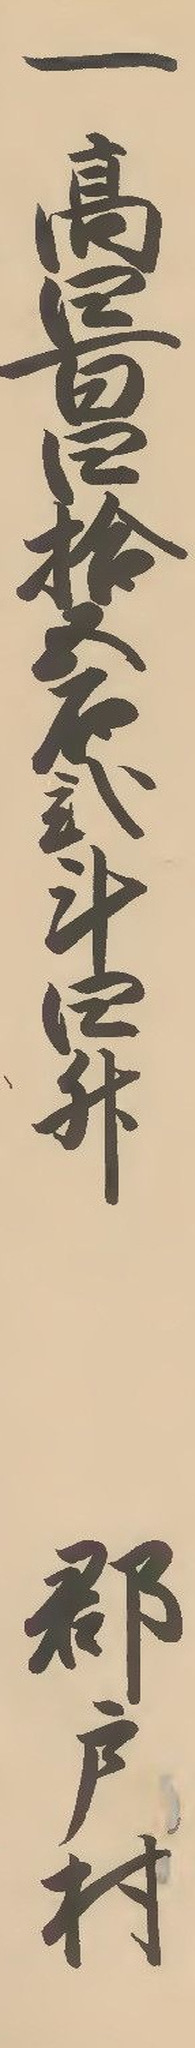一高四百四拾五石弐斗四升郡戸村
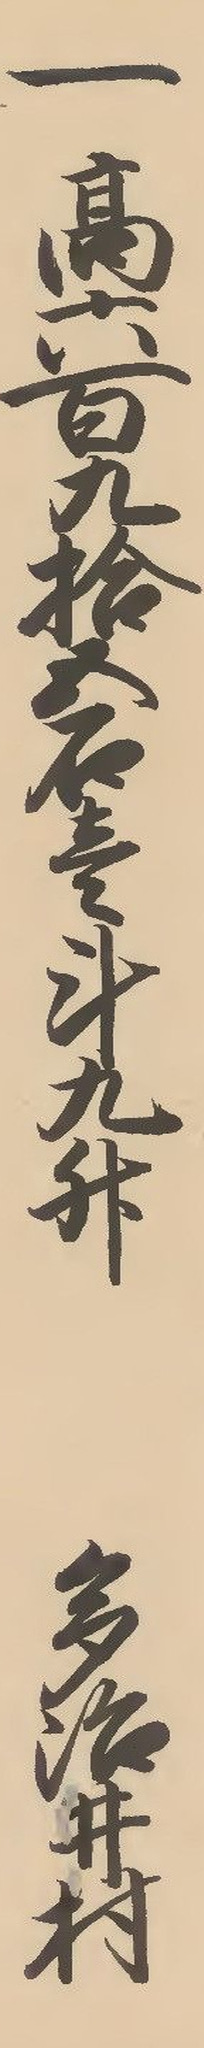一高六百九拾五石壱斗九升多治井村
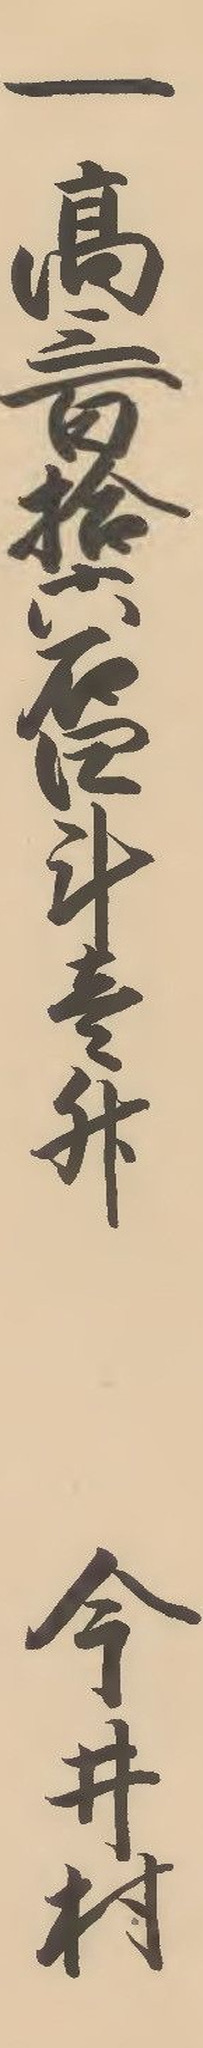一高三百拾六石四斗壱升今井村
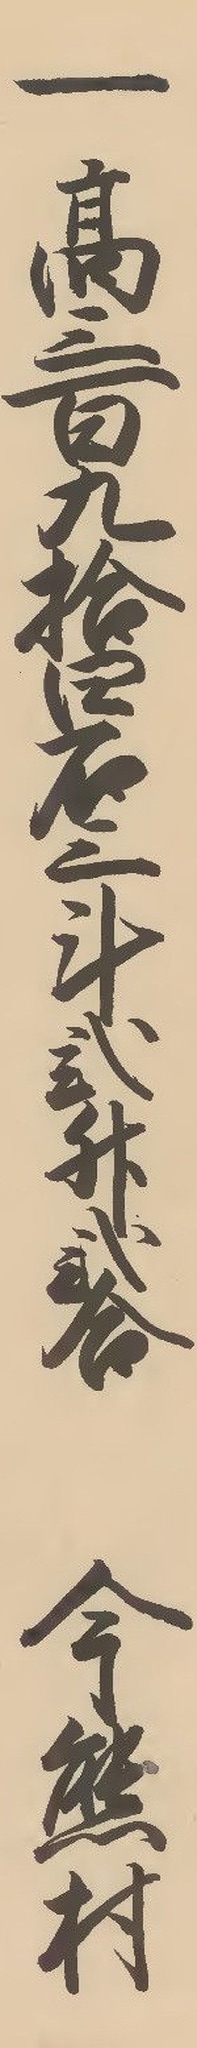一高三百九拾四石三斗弐升弐合今熊村
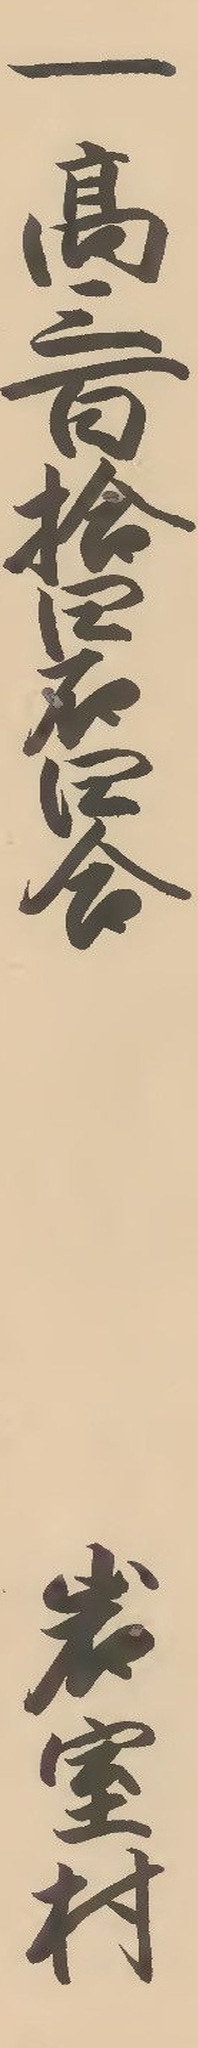一高三百拾四石四合岩室村

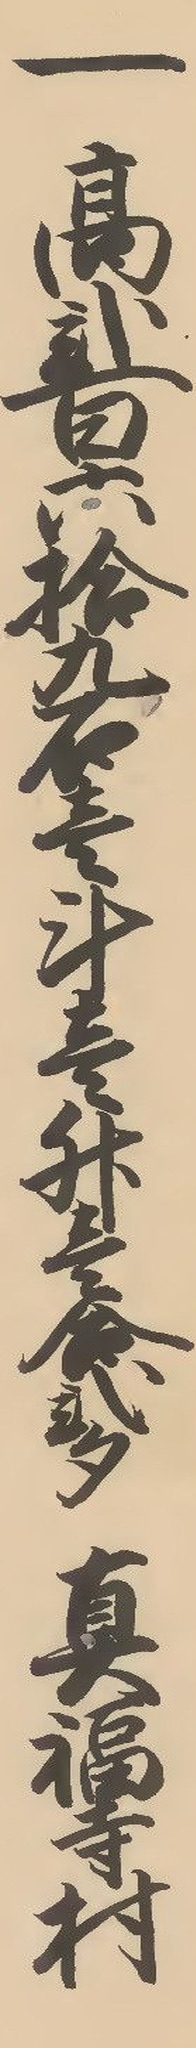一高弐百六拾九石壱斗壱升壱合弐尺真福寺村
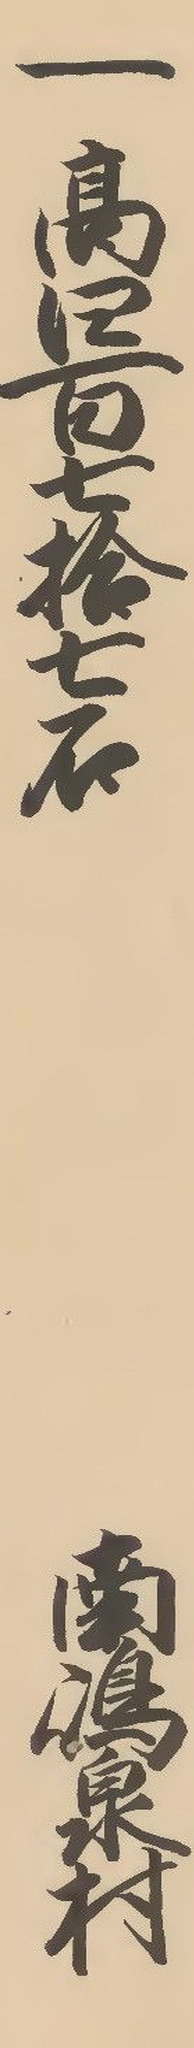一高四百七拾七石南島泉村
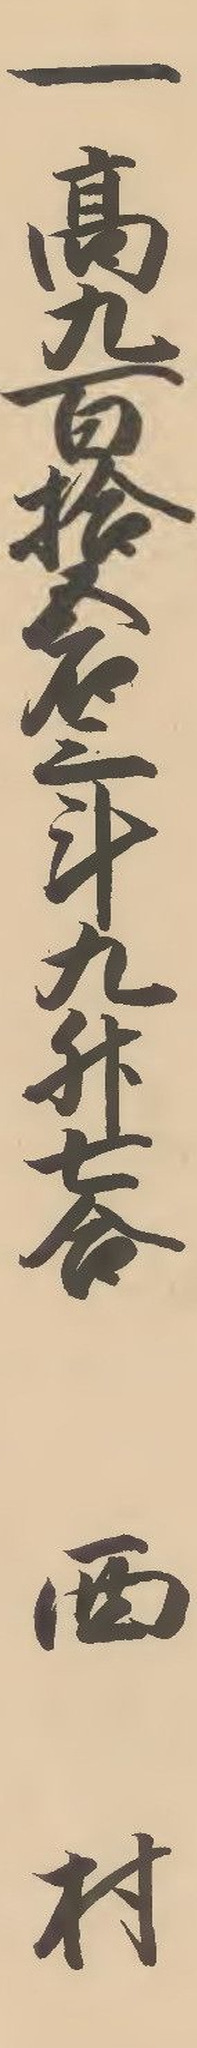一高九百拾五石三斗九升七合西村
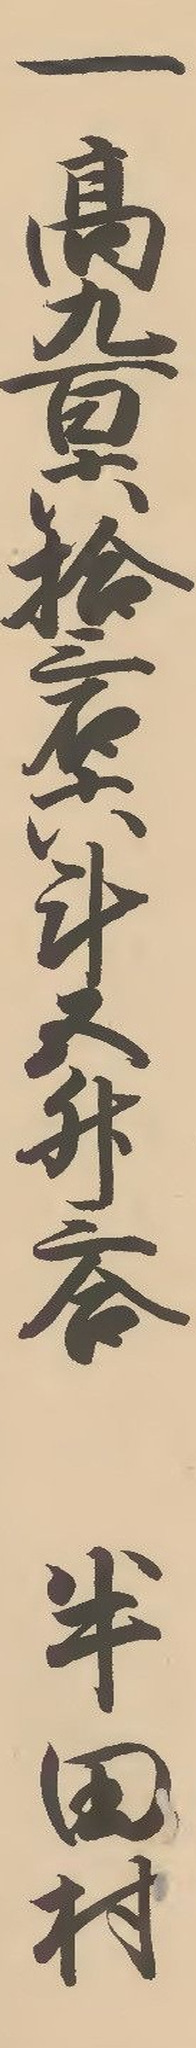一高九百六拾三石六斗五升三合半田村
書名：河内国郷帳
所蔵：国立公文書館 National Archives of Japan
